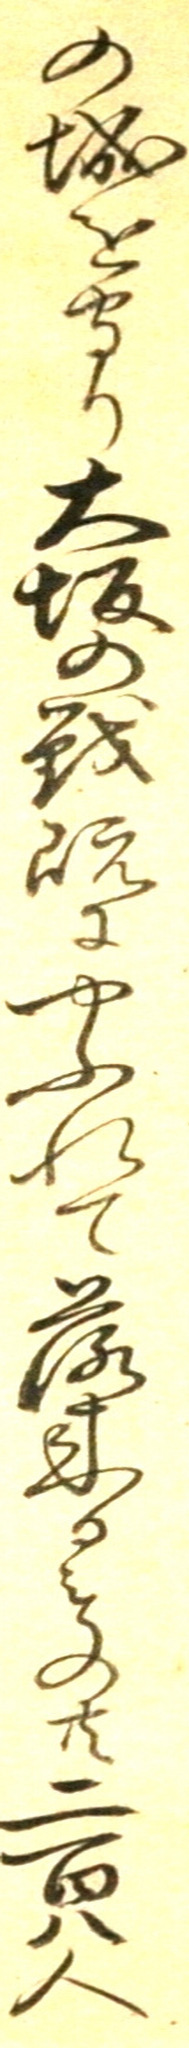の城を守り大坂の城既にやふれて落来るもの共二百八人
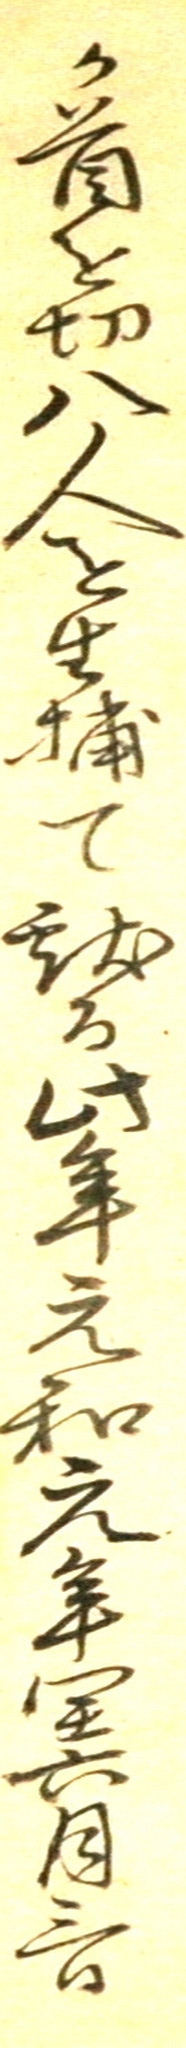か首を切八人を生捕て献る此年元和元年閏六月三日
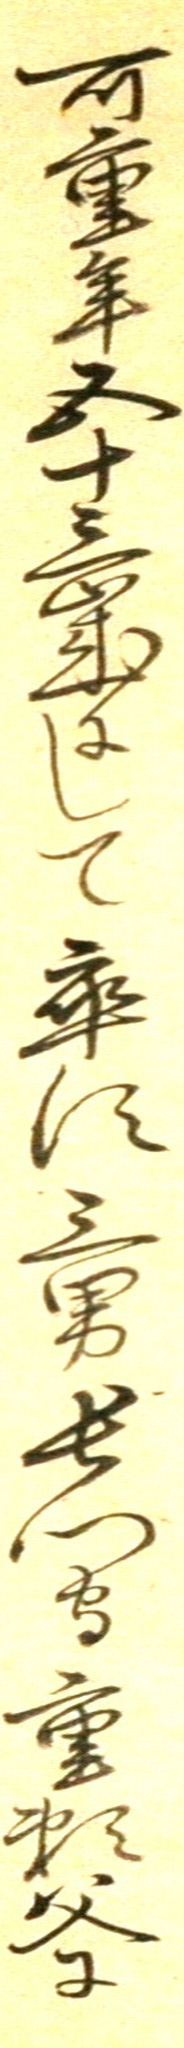可重年五十三歳にして卒す三男長門守重頼父に
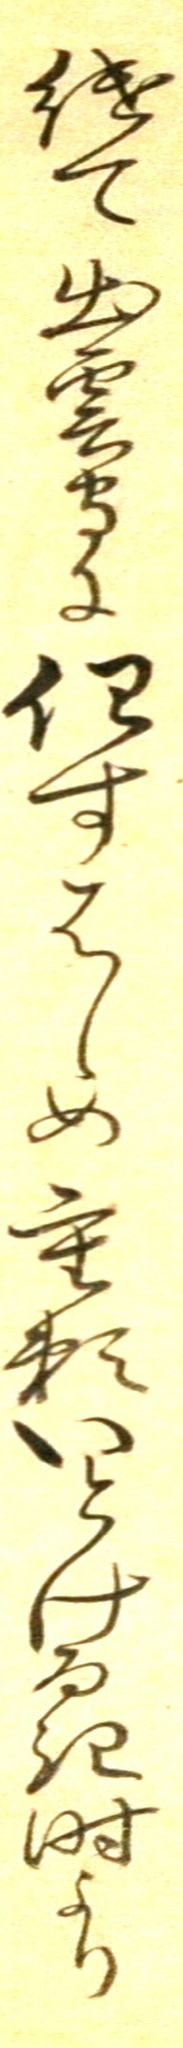継て出雲守に任すはしめ重頼いとけなき時より
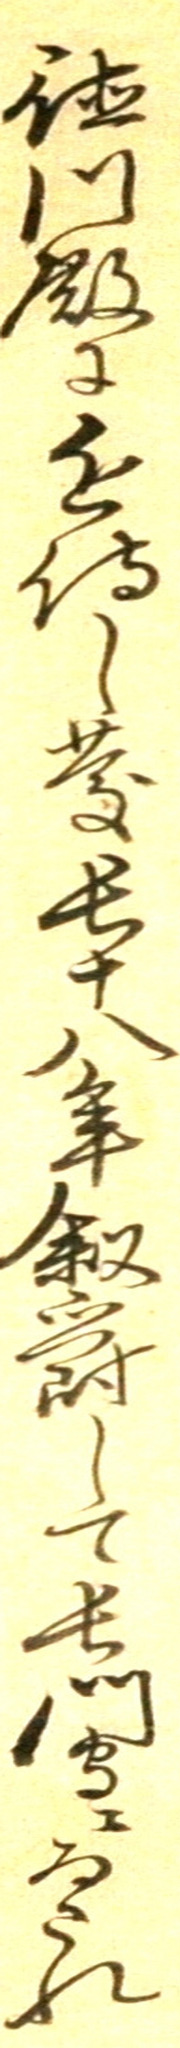徳川殿に近侍し慶長十八年叙爵して長門守になされ
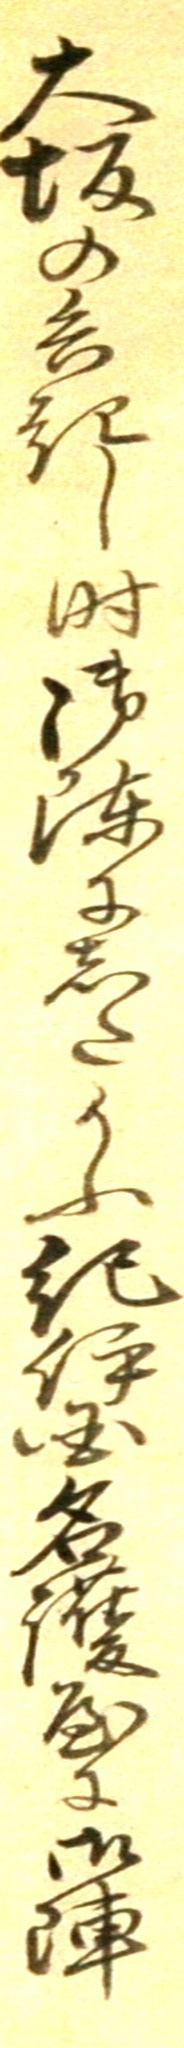大坂の兵起し時御陣にしたかふ紀伊国名護屋に御陣
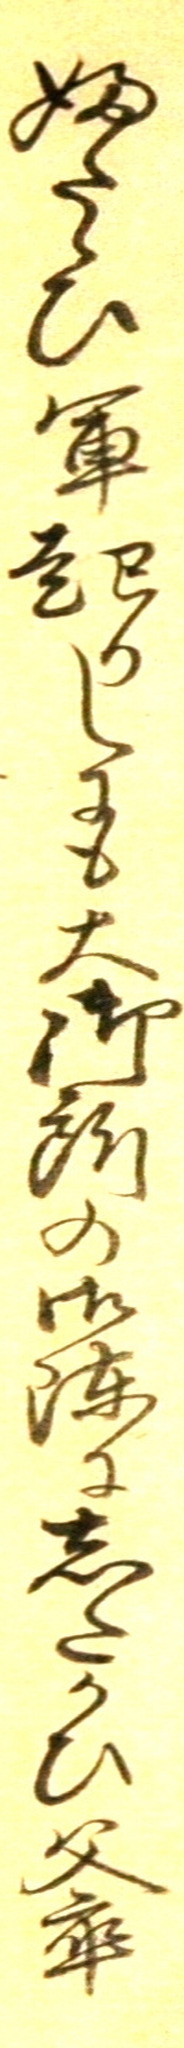ふたゝひ軍起りしにも大御所の御陣にしたかひ父卒

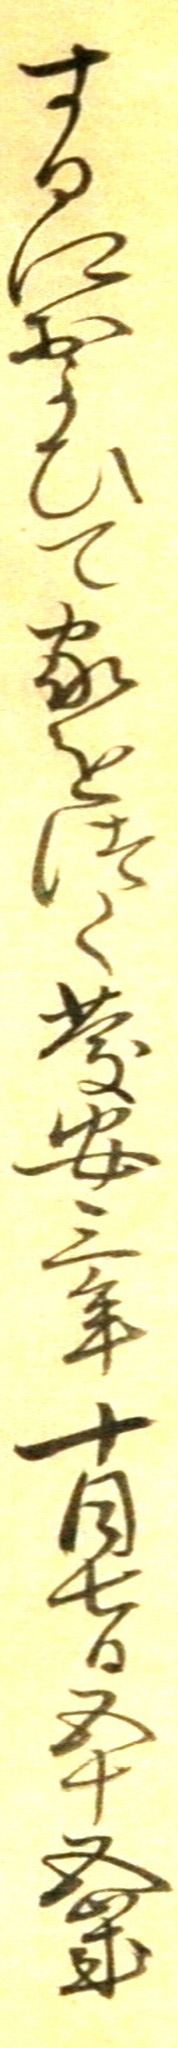するにおよひて家をつく慶安三年十月七日五十五歳
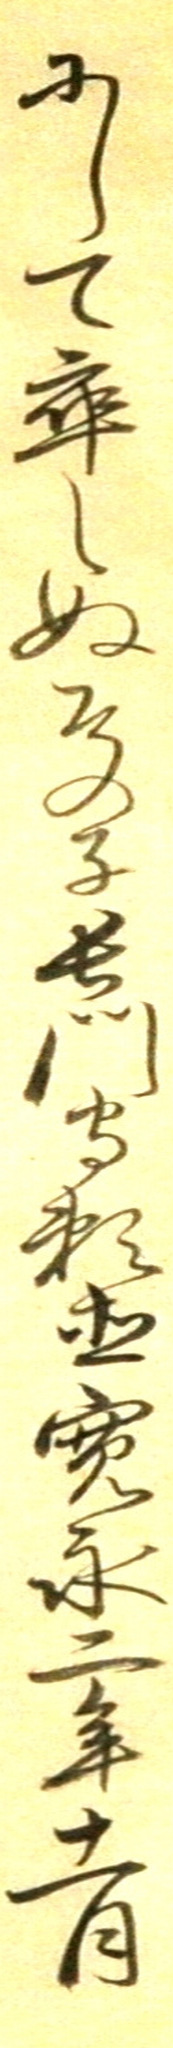のいして卒しぬその子長門守頼直寛永二年十一月
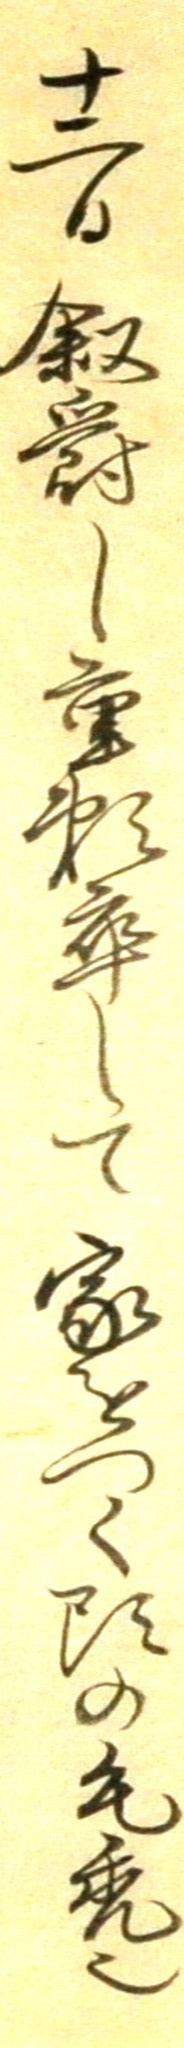十二日叙爵し重頼卒して家をつく頭の毛禿也
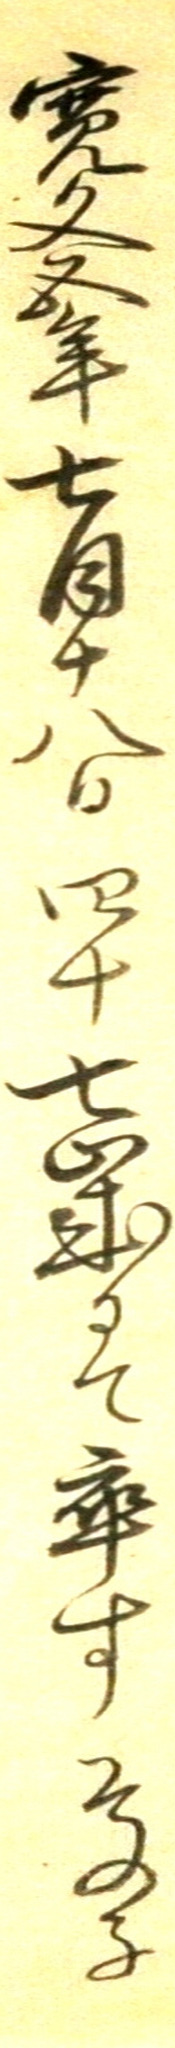寛文五年七月十八日四十七歳にて卒すその子
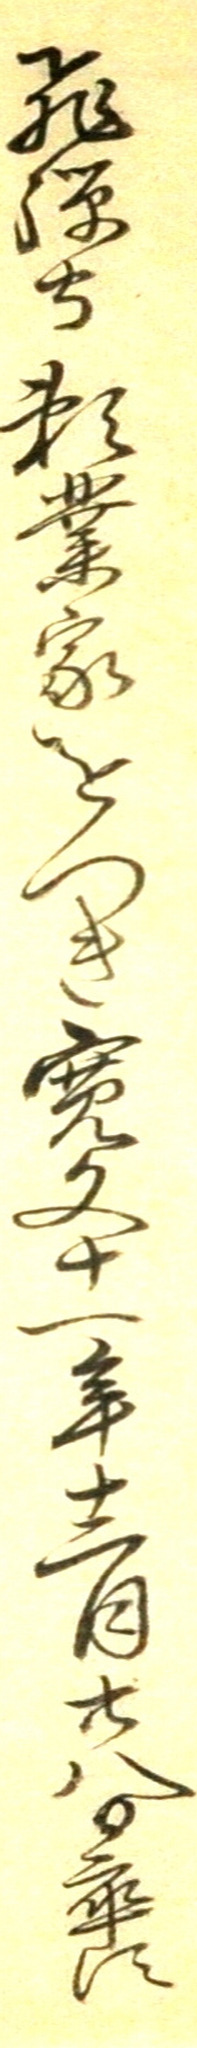飛騨守頼業家をつき寛文十一年十二月廿八日卒す
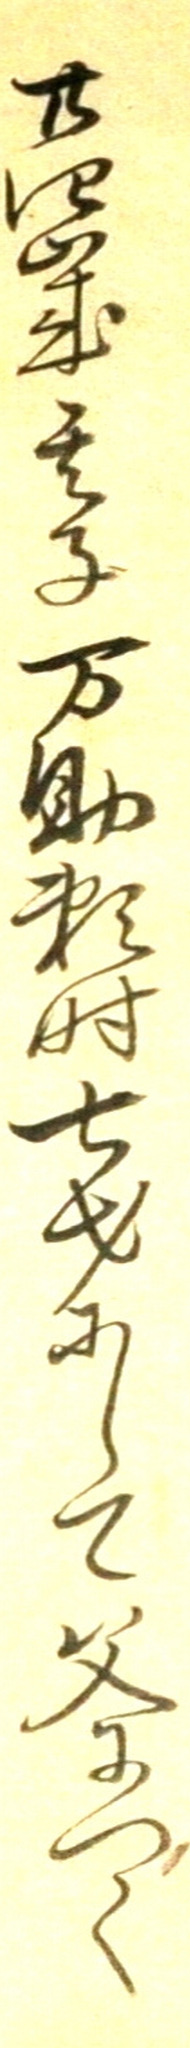廿四歳其子万助頼時七才にして父につく
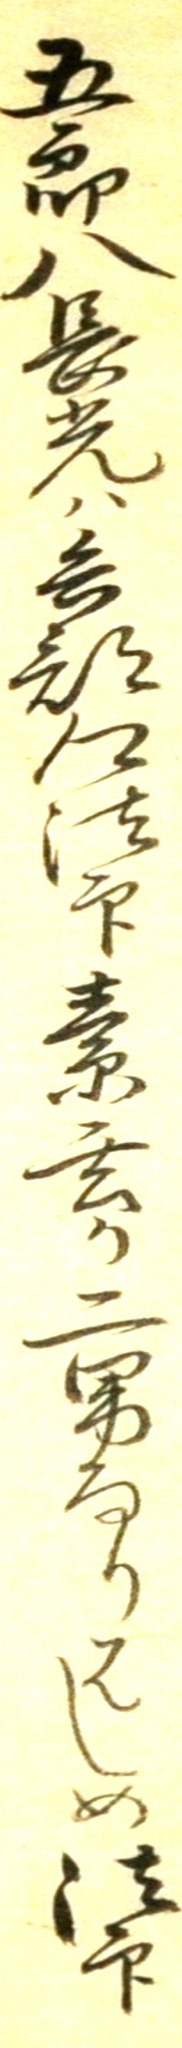五郎八長光は兵部卿法印素玄か二男なりはしめ法印
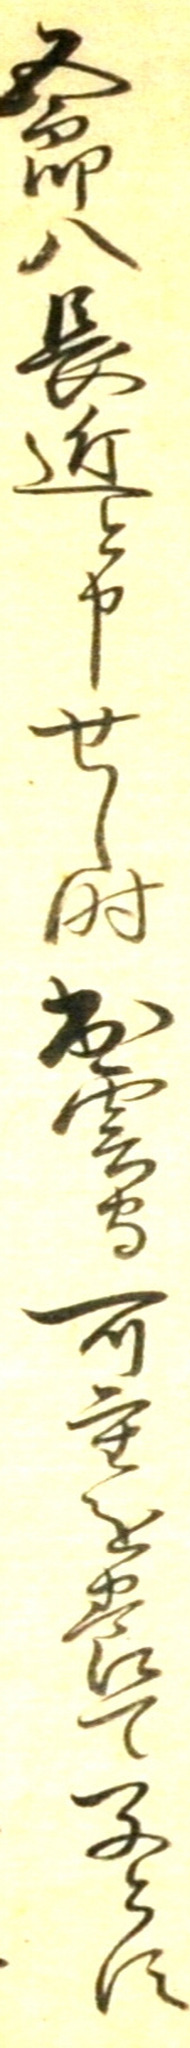五郎八長近と申せし時出雲守可重を養て子とす
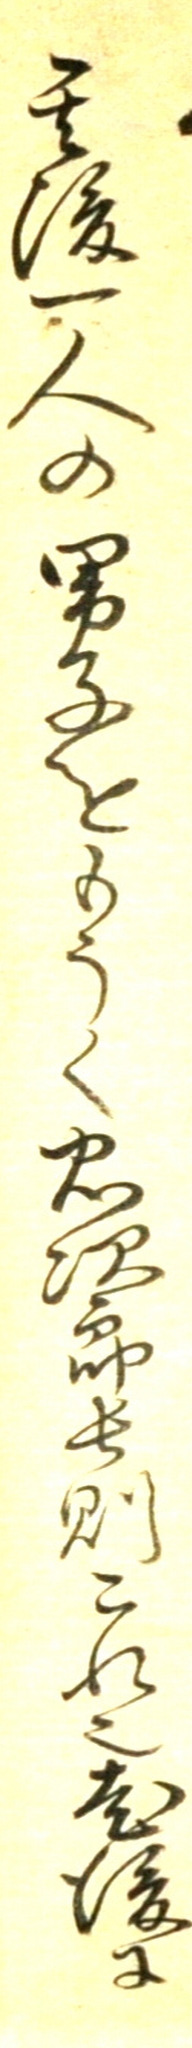其後一人の男子をもうく忠次郎長則これ也老後に
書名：藩翰譜（九・上）
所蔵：伊那市立高遠町図書館・合同会社AMANE
